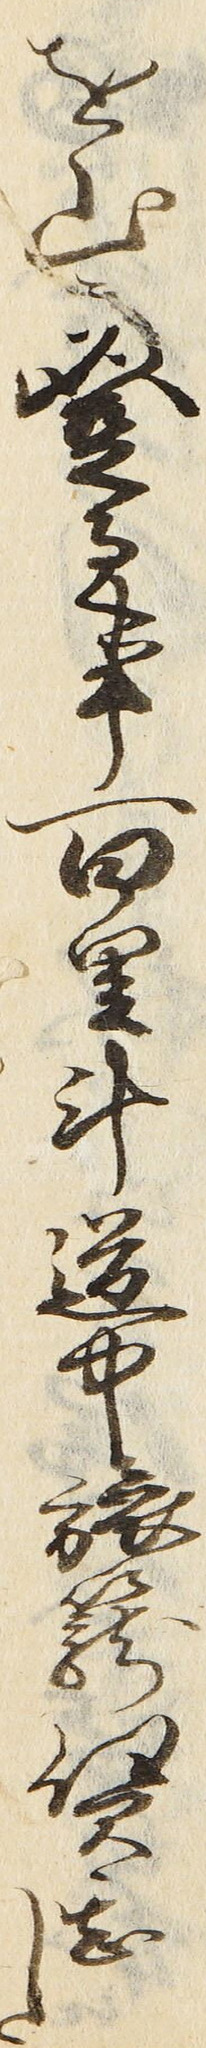を山ニ登る事百里斗道中旅籠賃甚しく
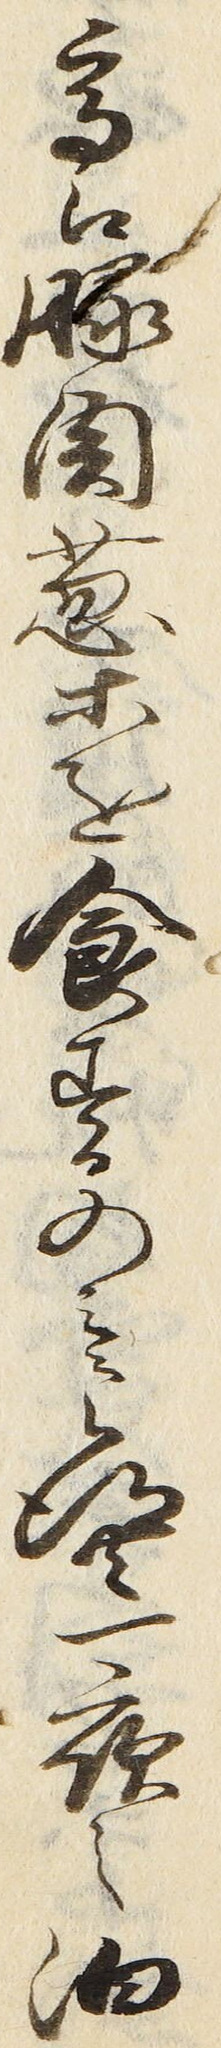高江豚肉葱等を食するのみニ候得共一夜之泊
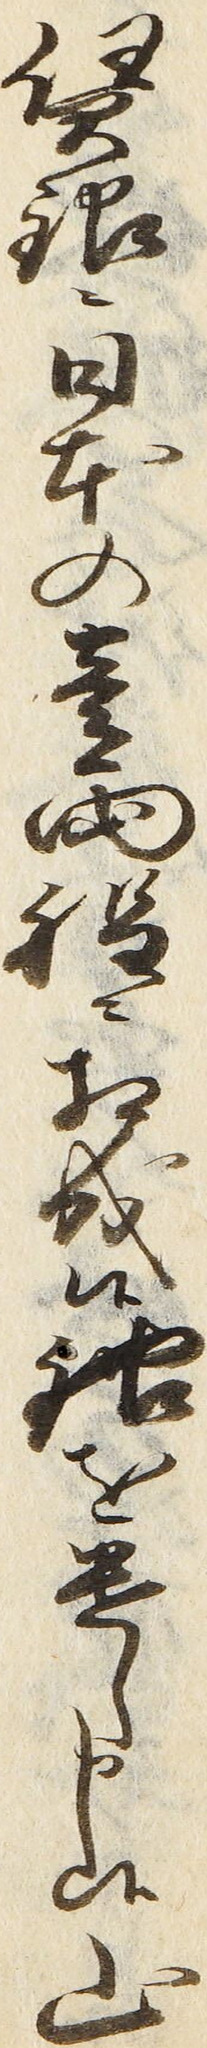賃銀日本の壱両程ニ相成候銀を遣し申候山
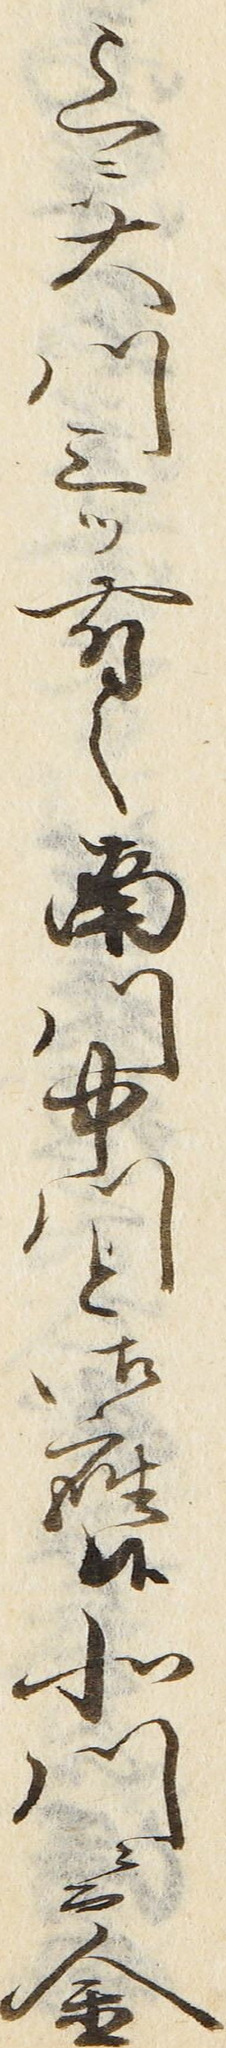上ニ大川三ツ有之南川中川と御座候北門ニ而金
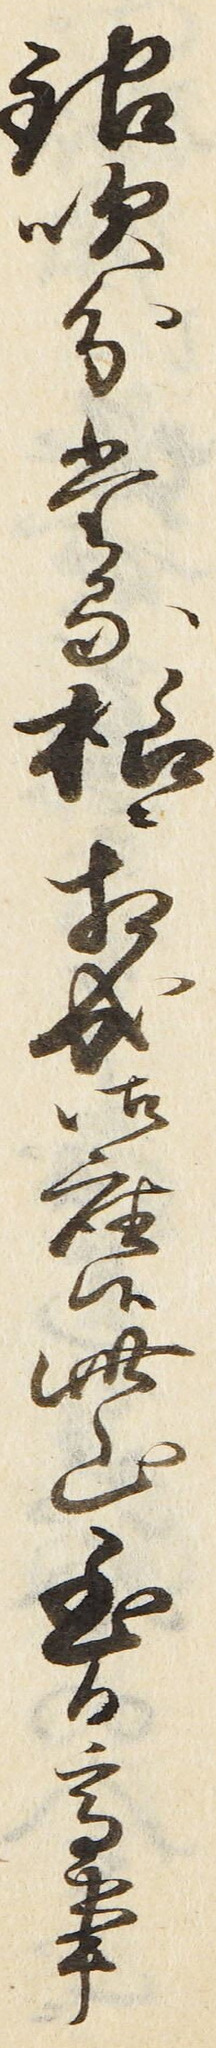銀吹分たる様ニ相成御座候此山至而高事
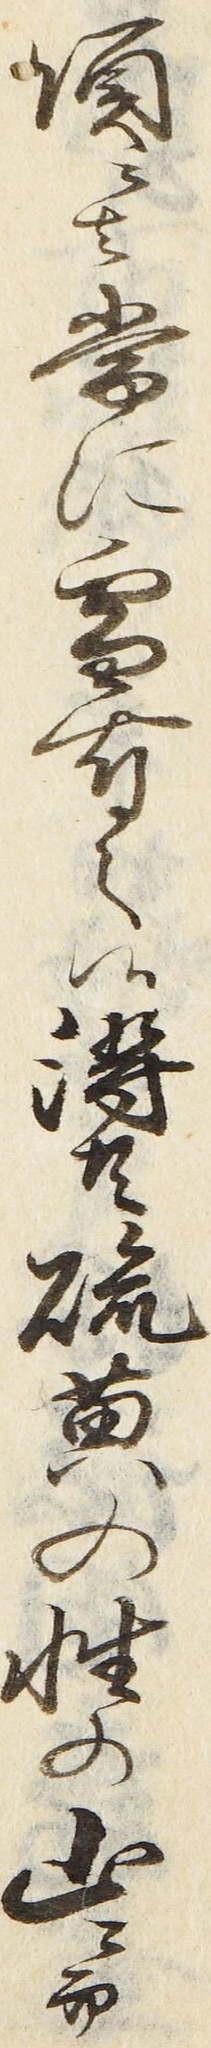頂ニ者常に雪有之候得共硫黄の性の山ニ而
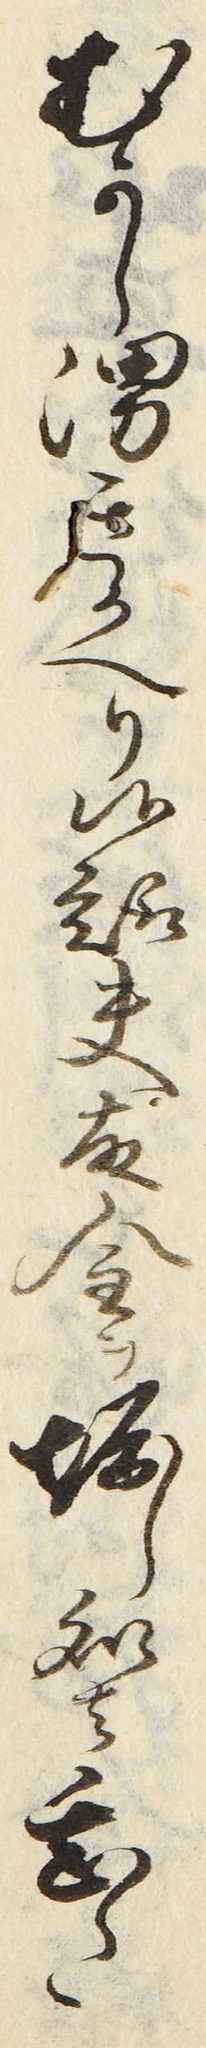むかし湧きかへり候趣夫故金ヲ堀し処者甚た
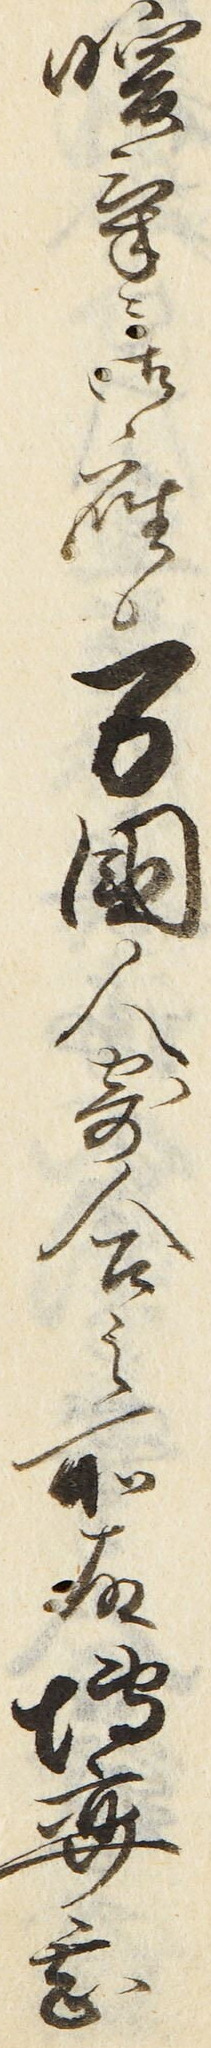暖氣ニ御座候万國人寄合之所故博奕甚
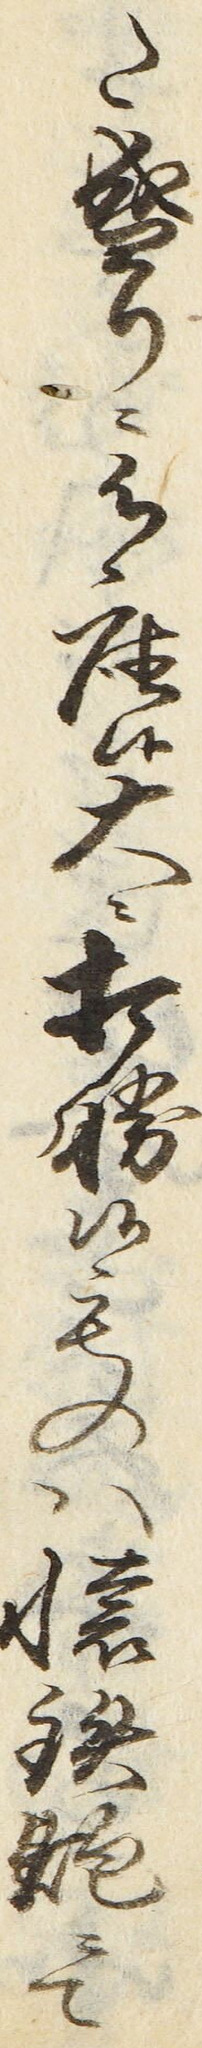た盛りニ御座候大ニ打勝候ものハ懐鉄砲ニて
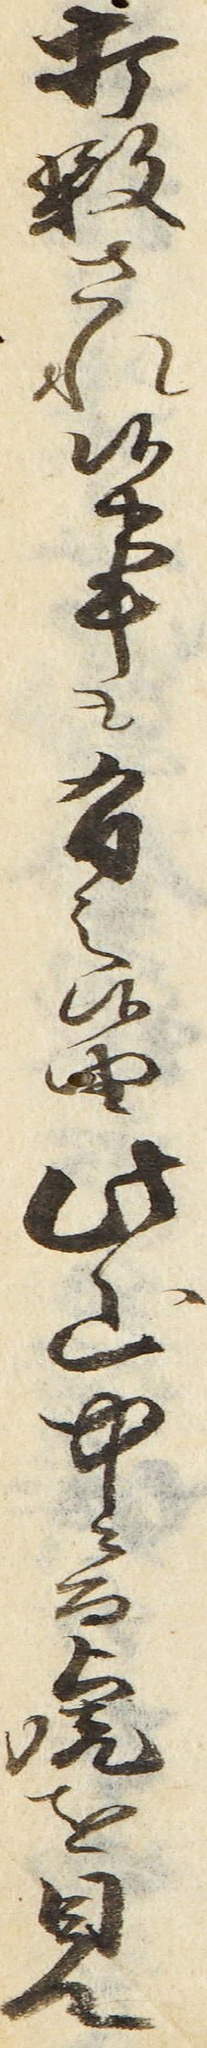打殺され候事も有之候由此山中ニ而虎を見

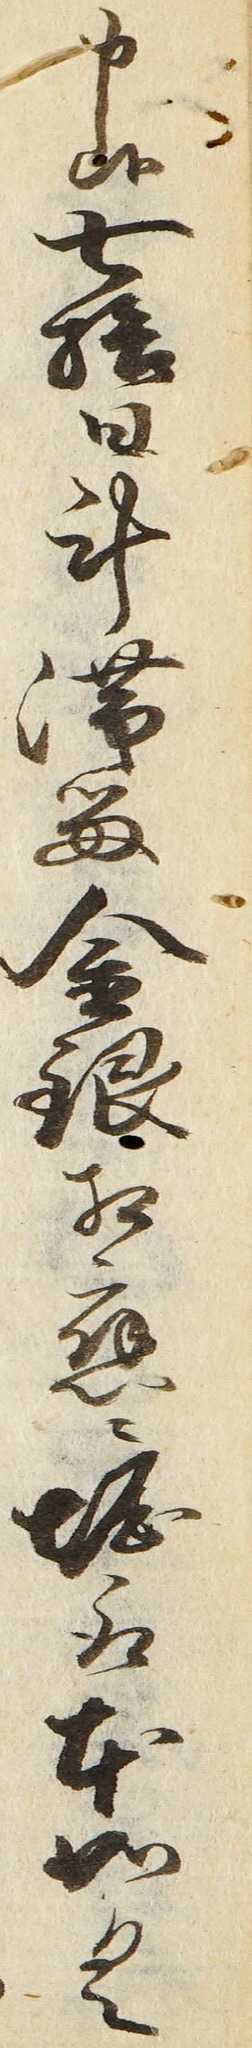申候七拾日斗滞留金銀相應ニ堀取本如く
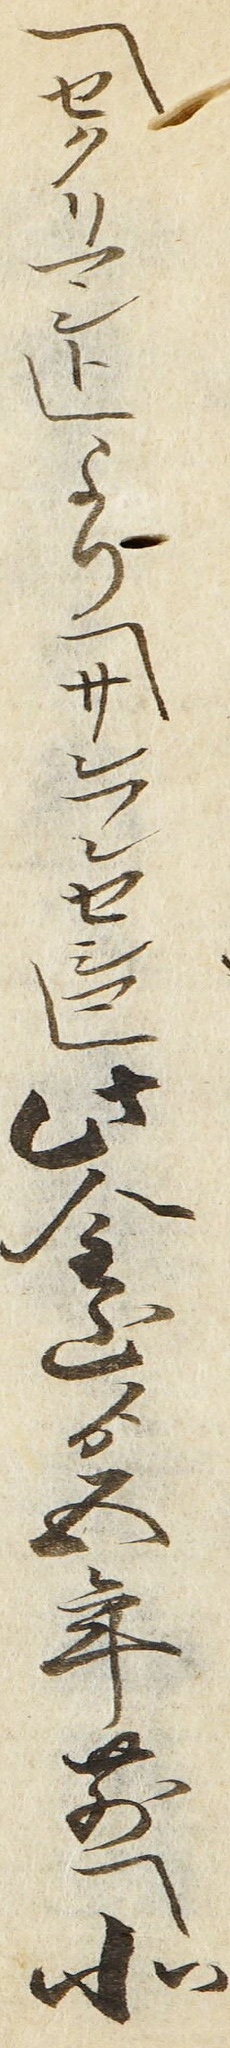「セクリマント」より「サンフレセシコ」此金山ゟ五年前「北
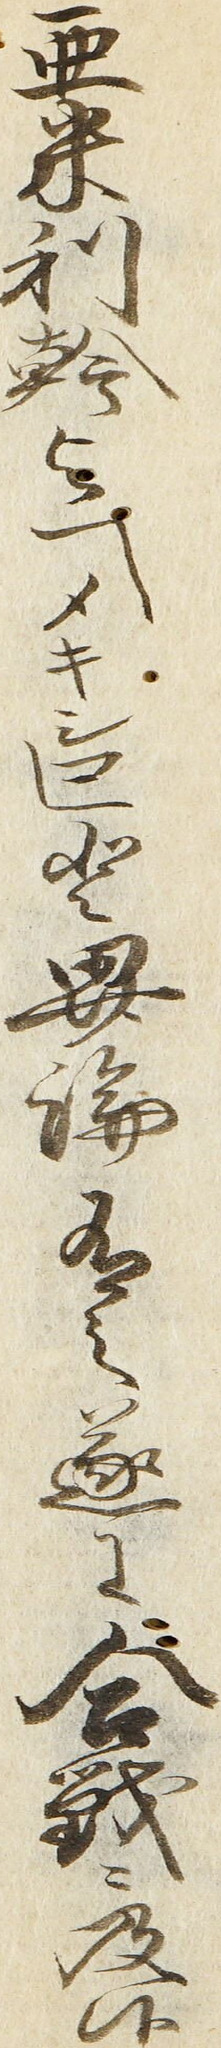亜米利幹と「メキシコ」と界論有之遂に合戦ニ及候
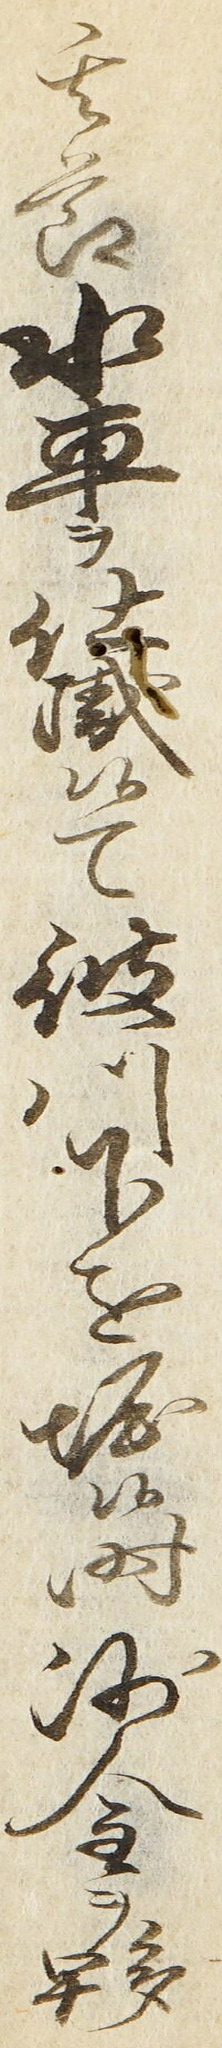其節水車ヲ仕掛候て彼川下を堀候時砂金ヲ夥
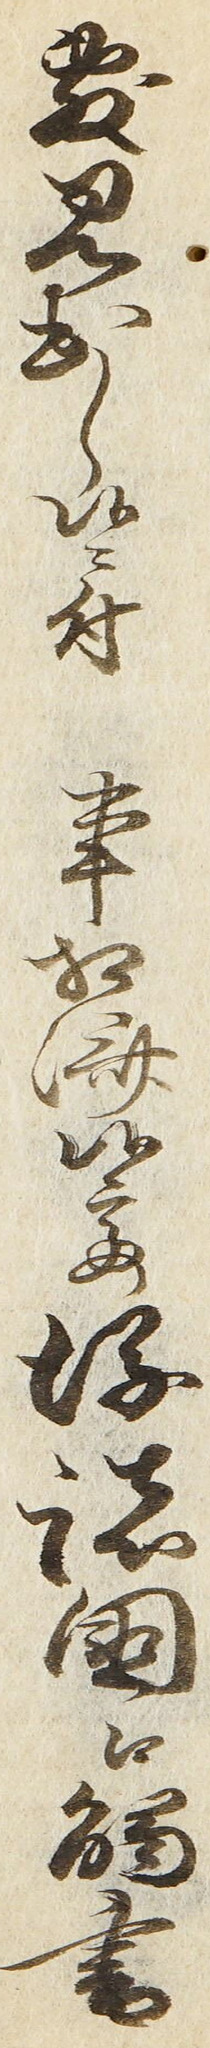敷見出し候ニ付事相済候て後諸國江觸書
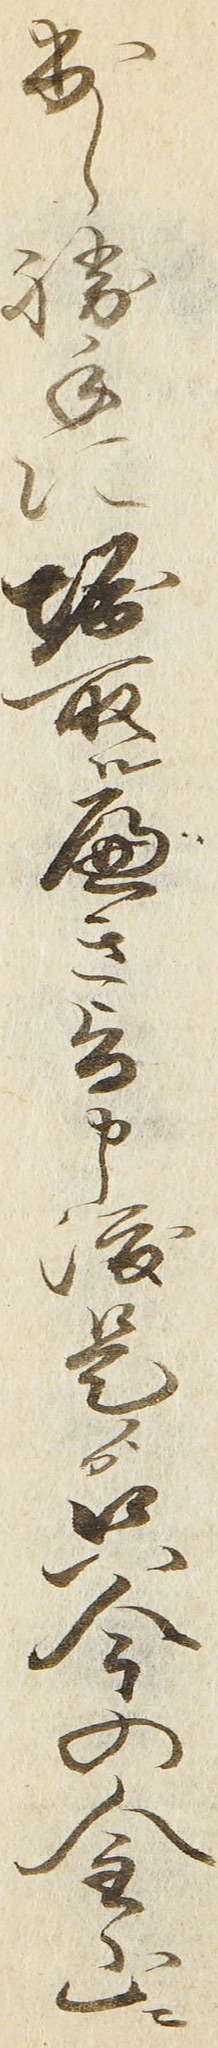出し勝手に堀取ルべき旨申渡是ゟ只今の金山ニ
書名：漂客談寄
